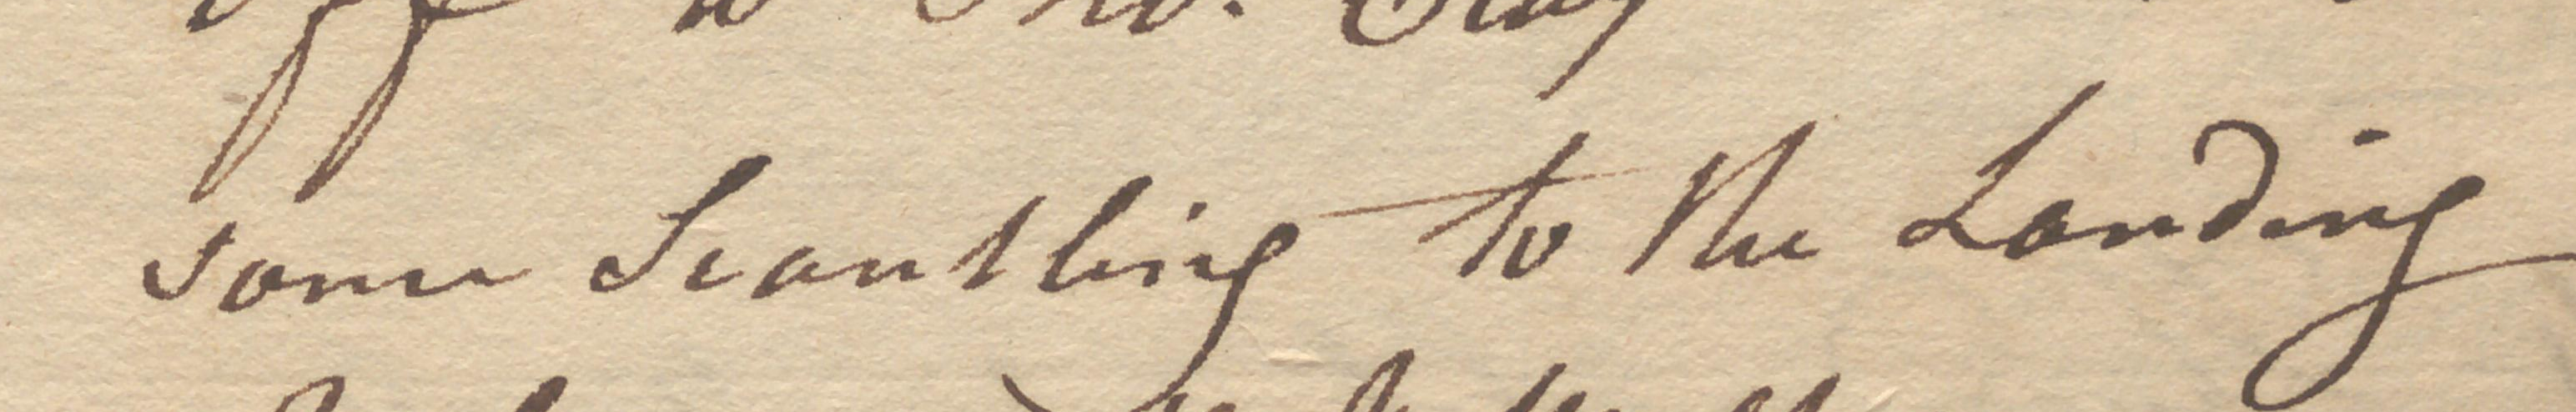some Scantling to the Landing
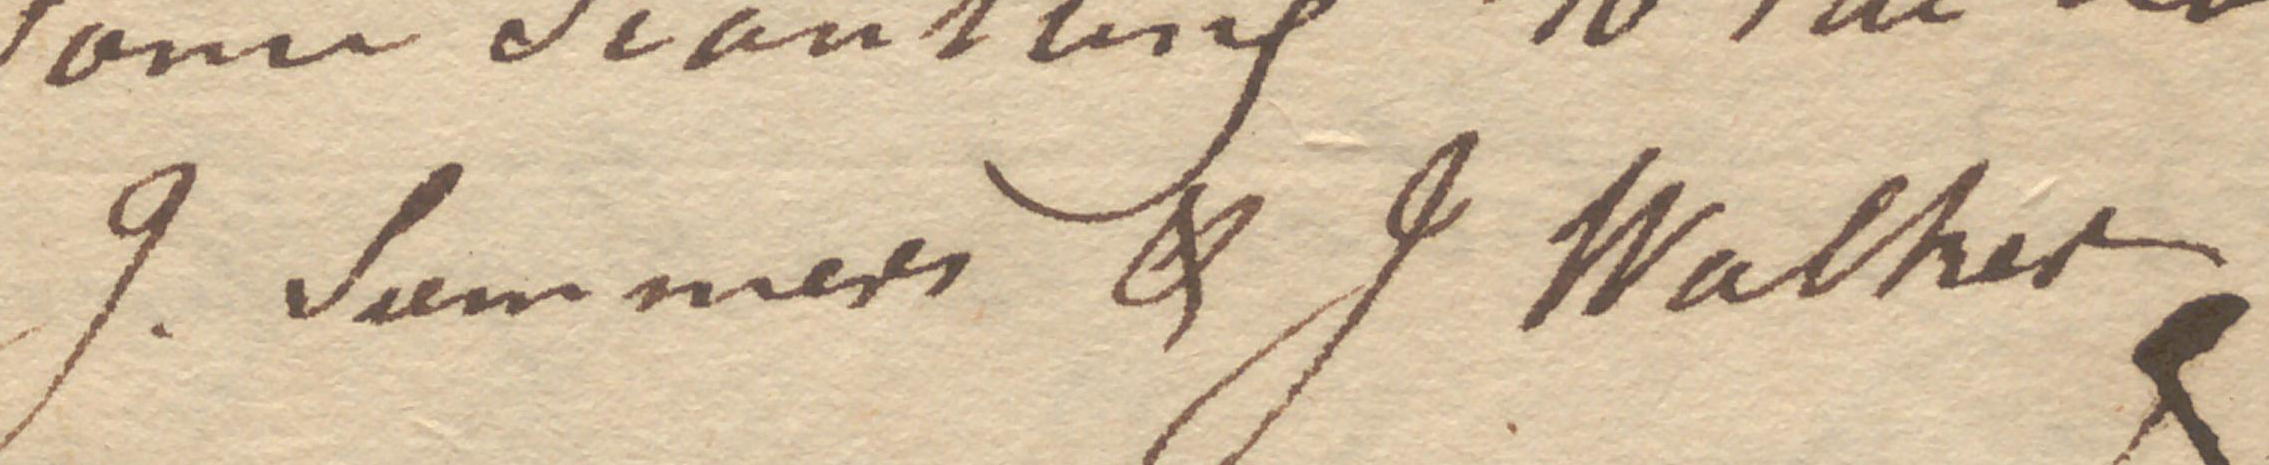J. Summers & J Walker
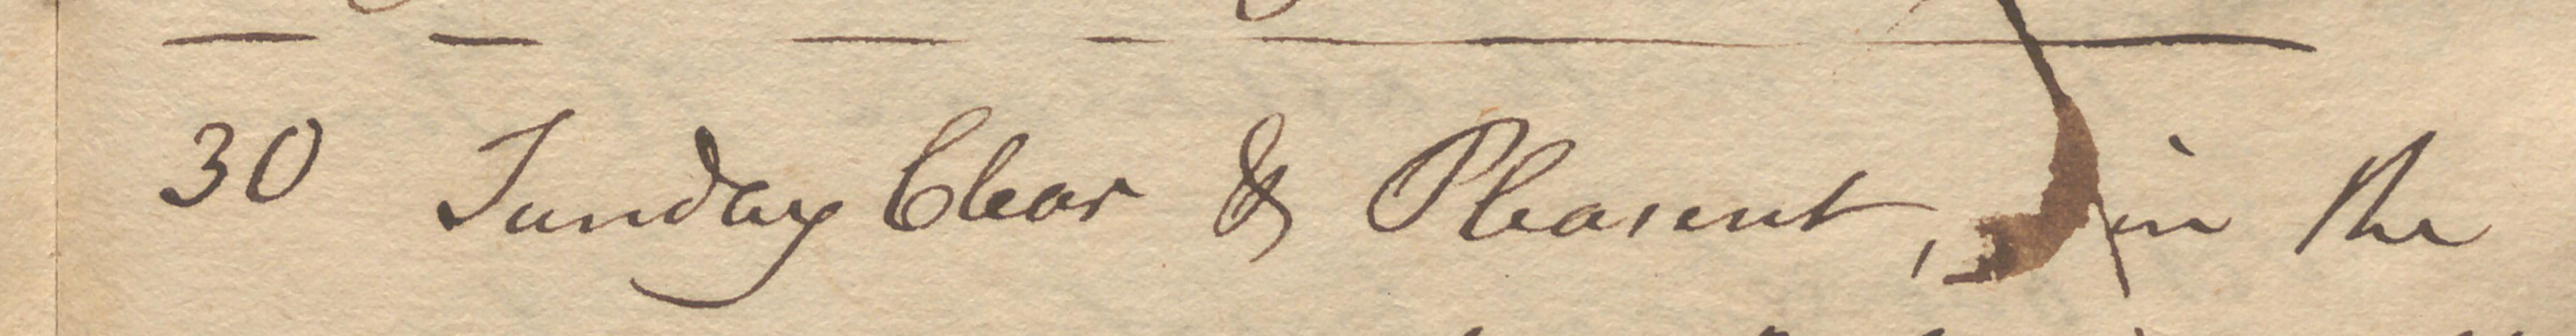30 Sunday Clear & Pleasent, in the
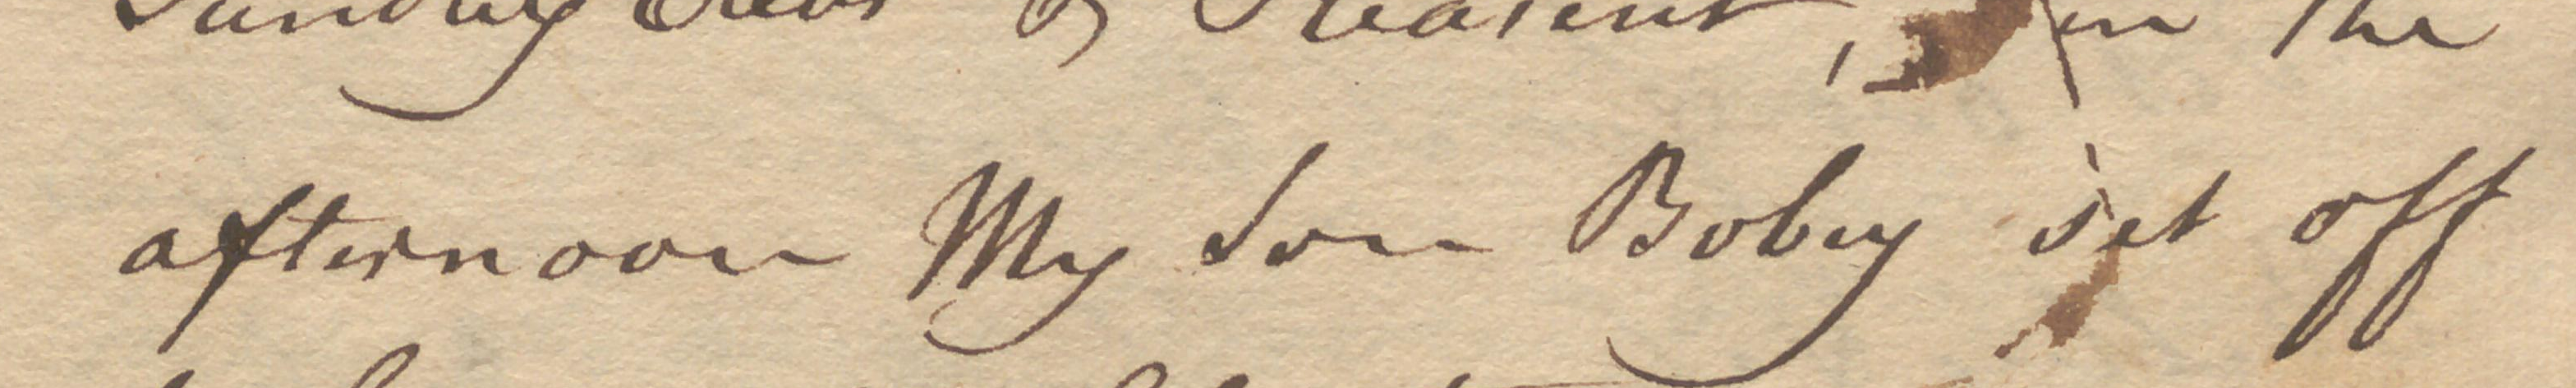afternoon My son Bobey set off
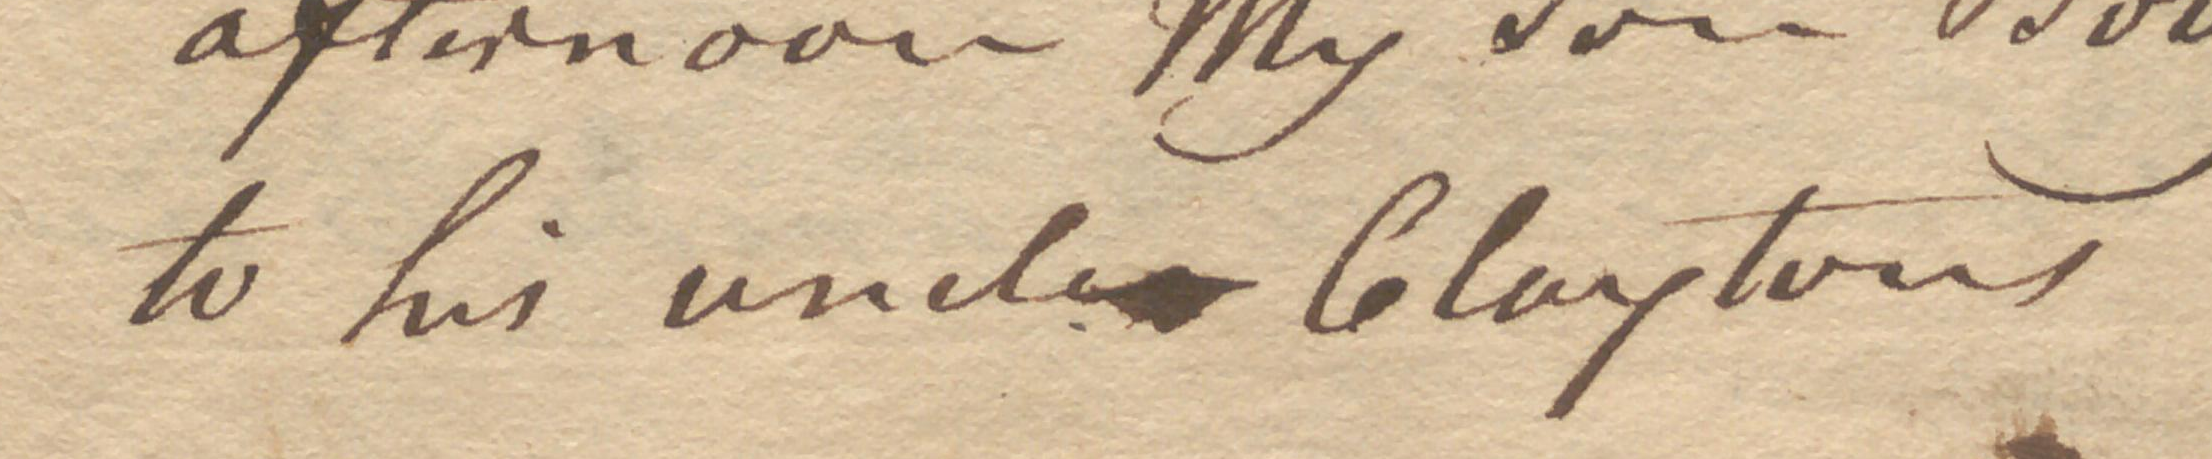to his uncle Claytons
